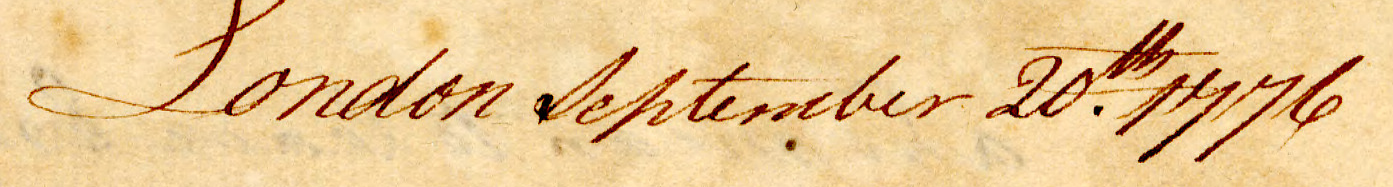London September 20^th. 1776
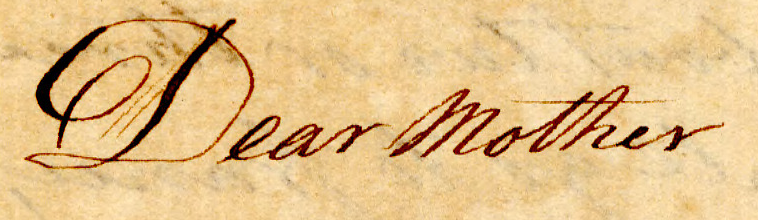Dear Mother
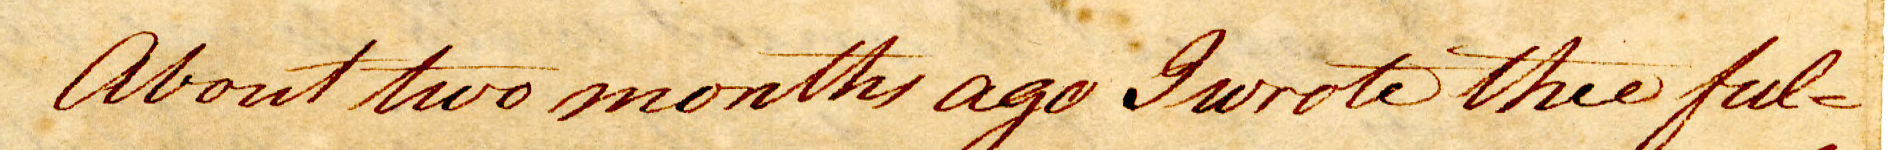About two months ago I wrote thee ful-
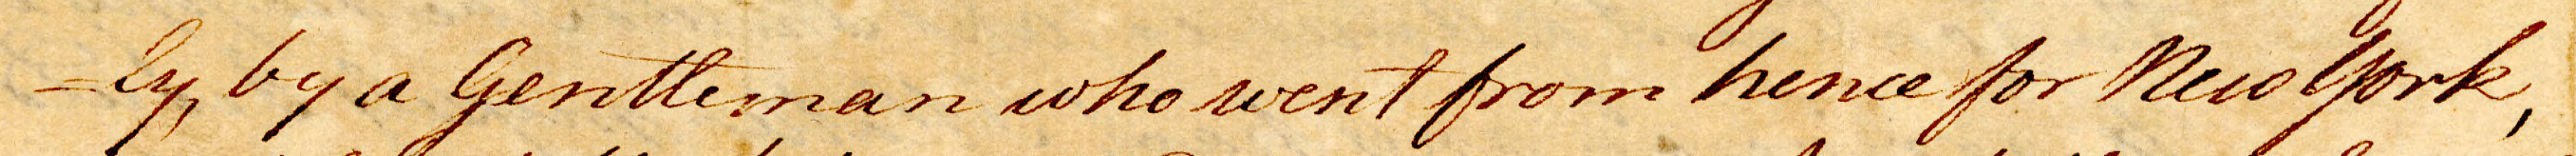-ly, by a Gentleman who went from hence for New York,
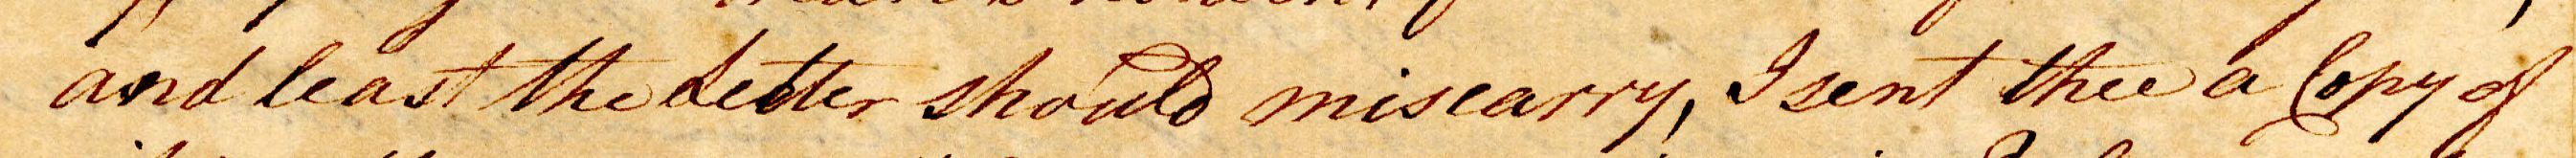and least the Letter should miscarry, I sent thee a Copy of
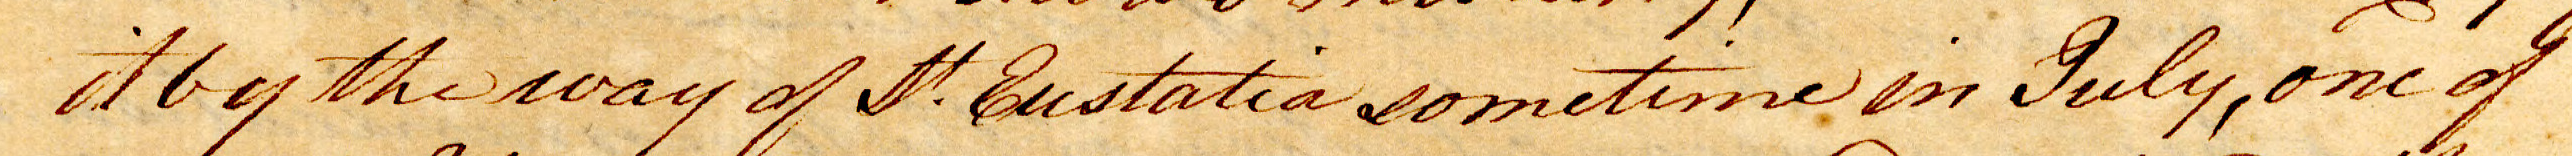it by the way of S^t. Eustatia sometime in July, one of
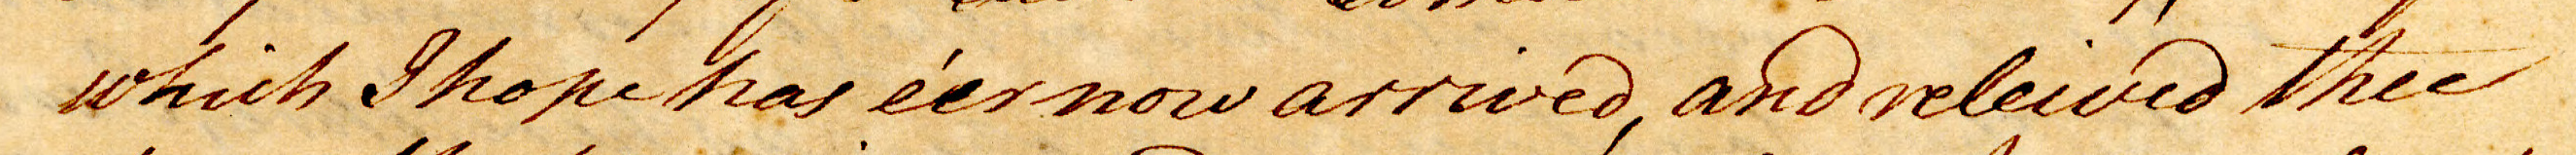which I hope has e'er now arrived, and releived thee
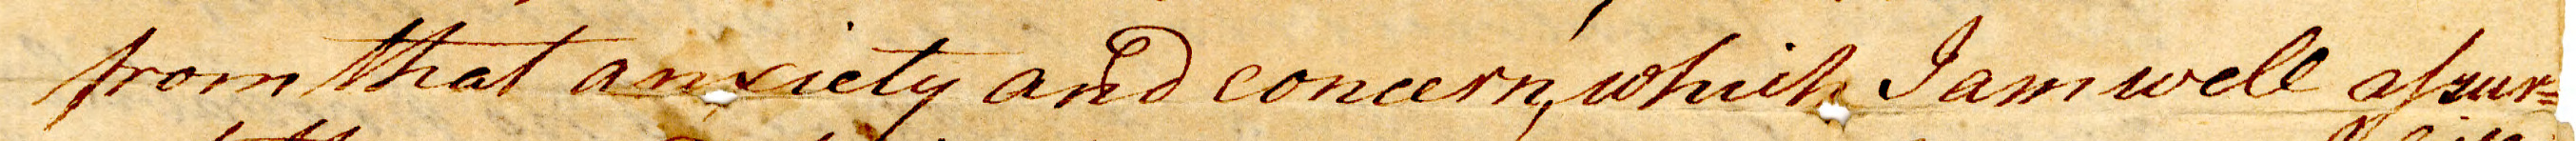from that anxiety and concern, which I am well assur-
